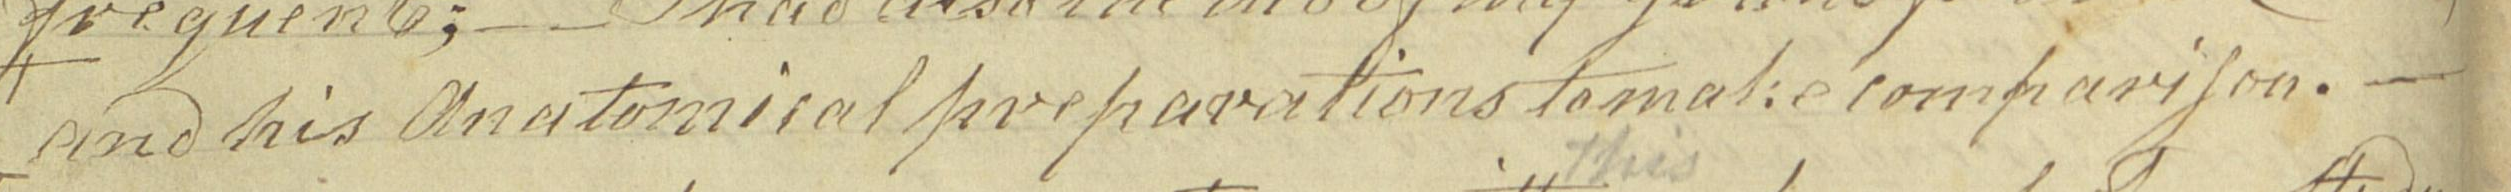and his anatomical preparations to make comparison.
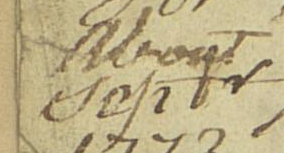Septr
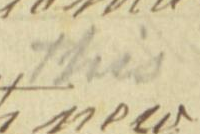this
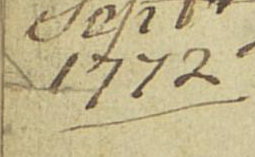1772
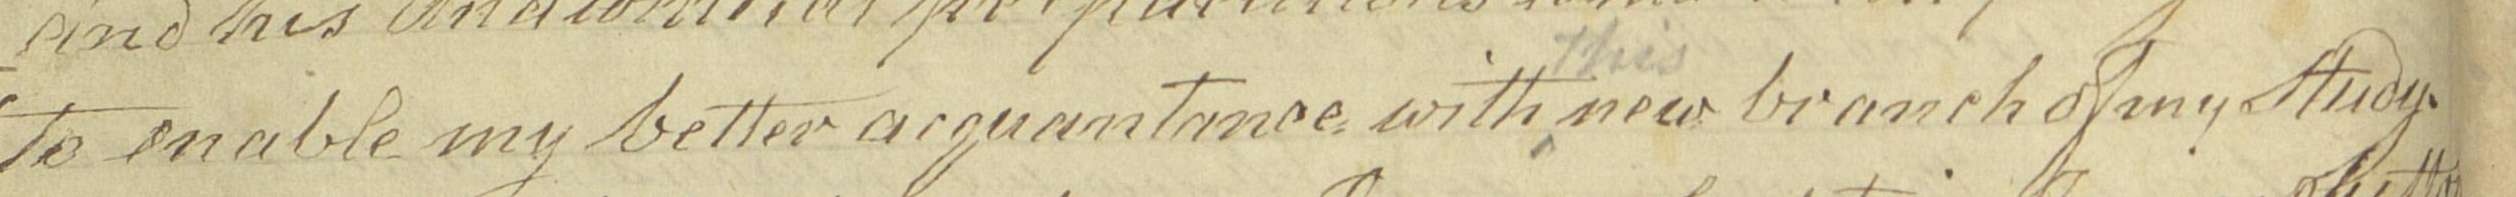to enable my better acquantance with ^ new branch of my Study.
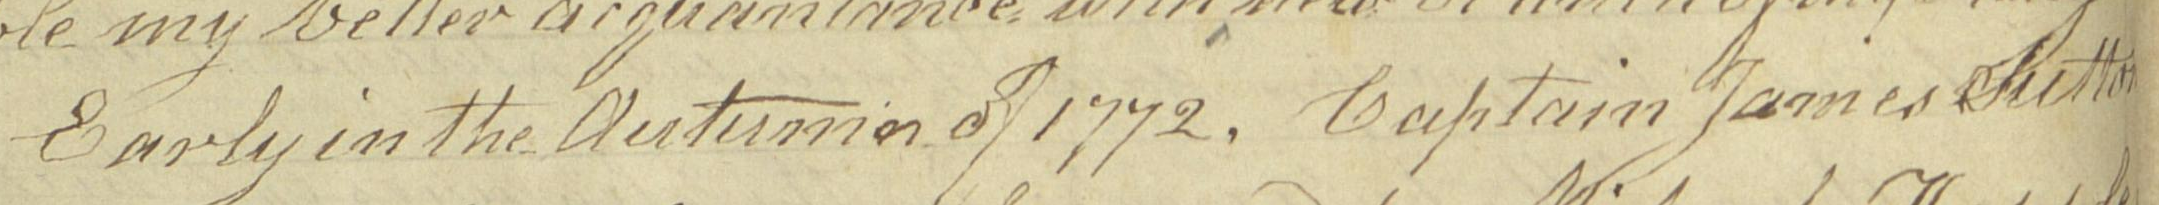Early in the Autumn of 1772. Captain James Sutton
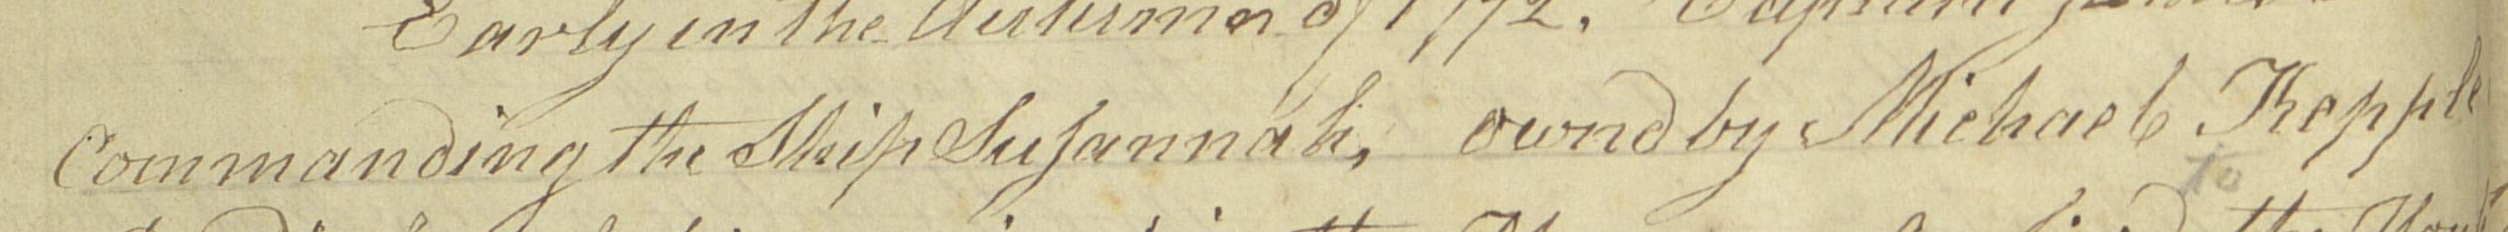commanding the Ship Susannah, ownd by Michael Ropple
